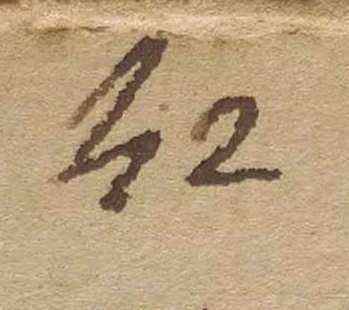42
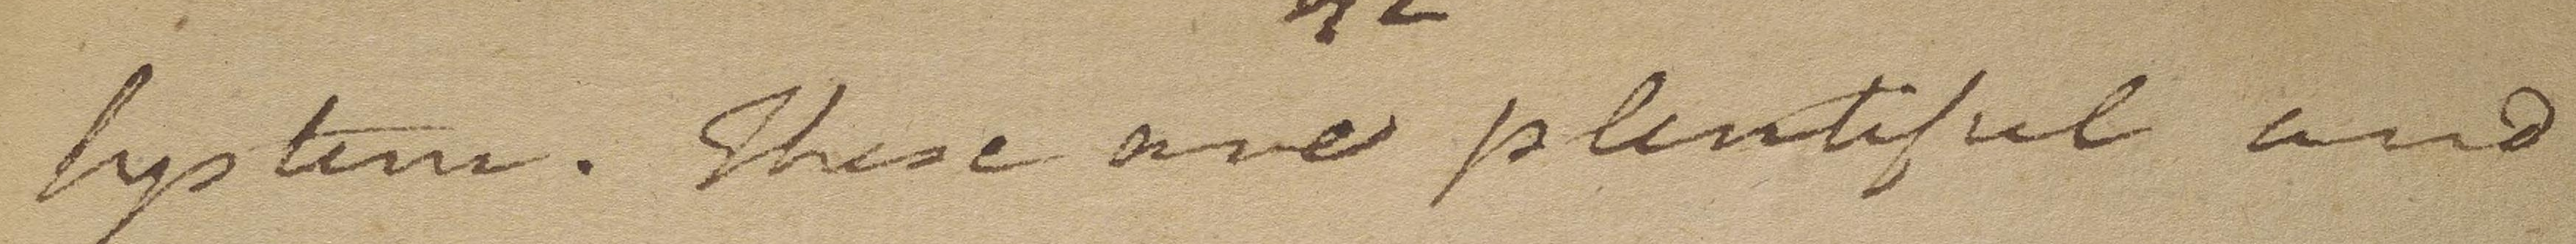system. These are plentiful and
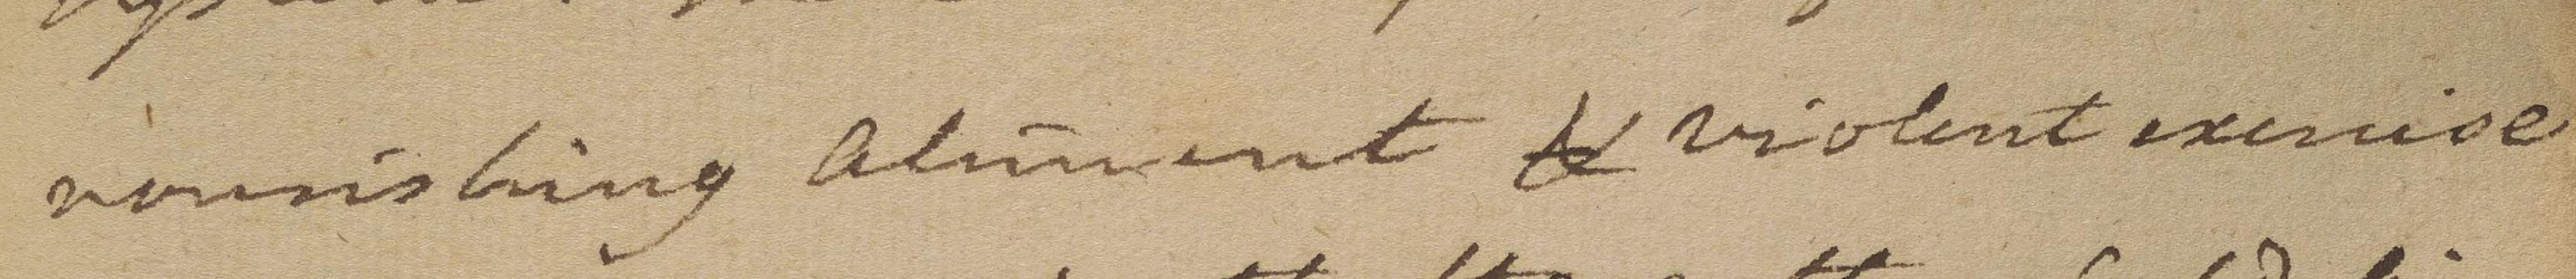vanishing aliment & violent exercise
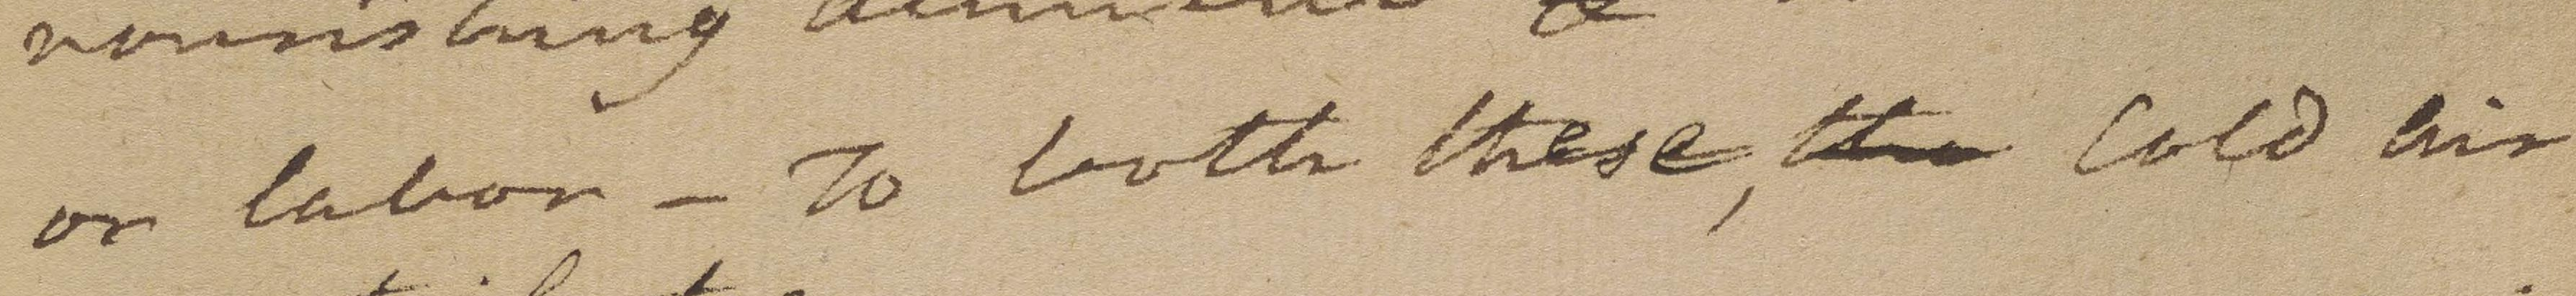or labor, to both these, [the] cold air
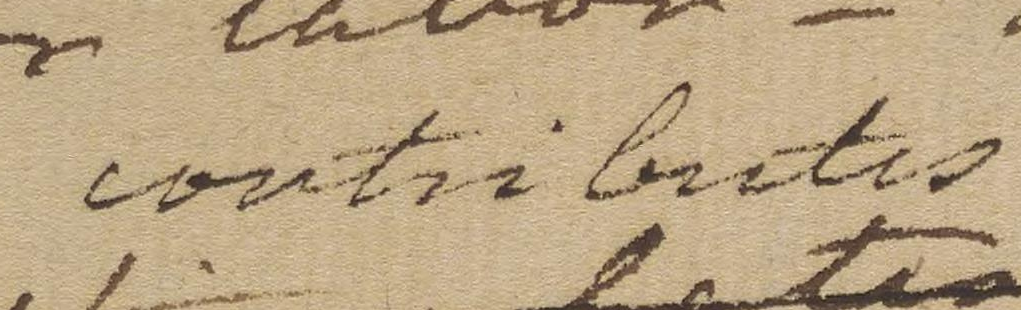contributes
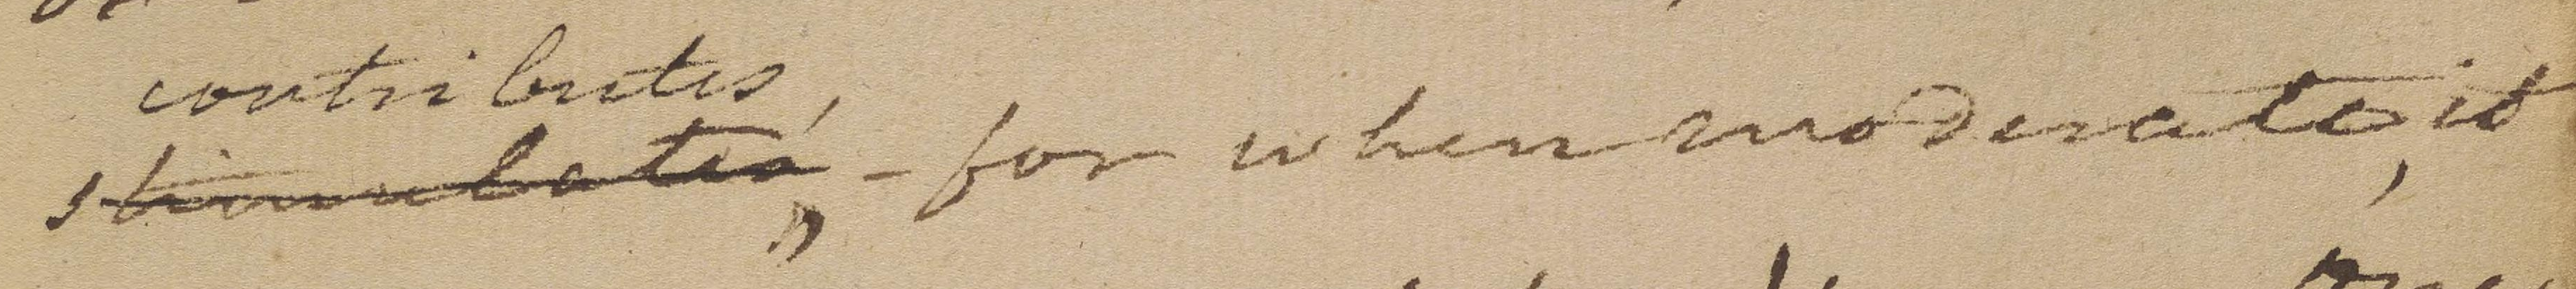[stimulates]- for when moderate, it
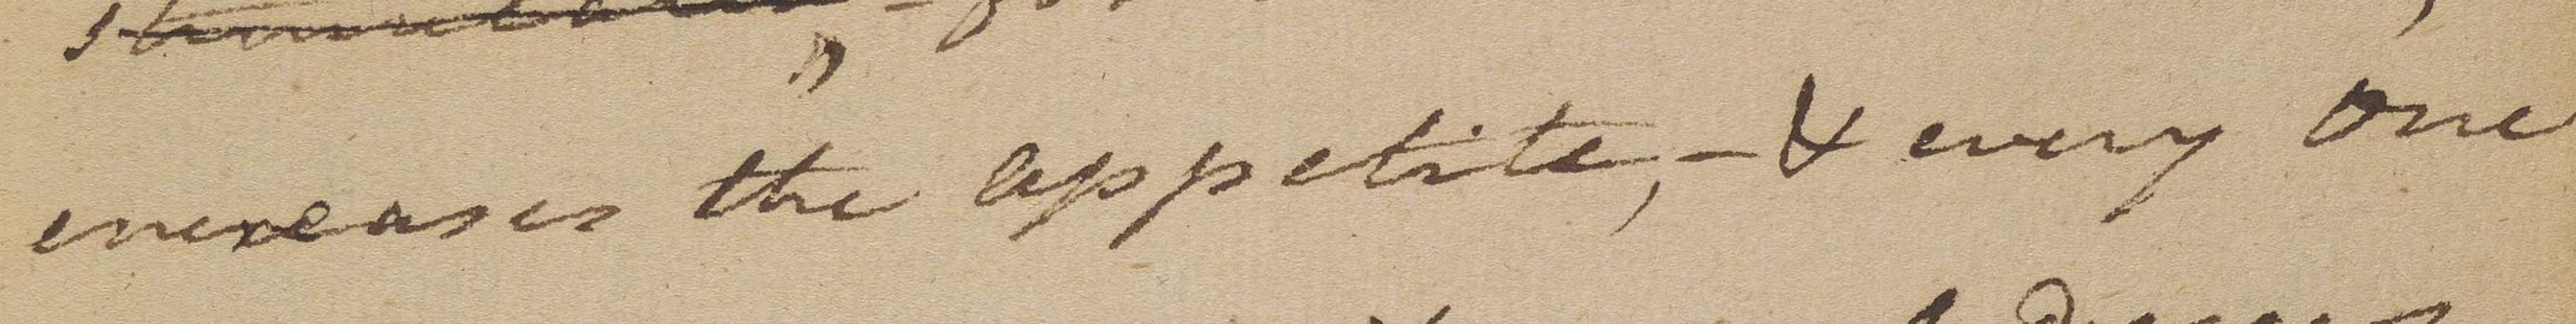encreases the appetite,- & every one
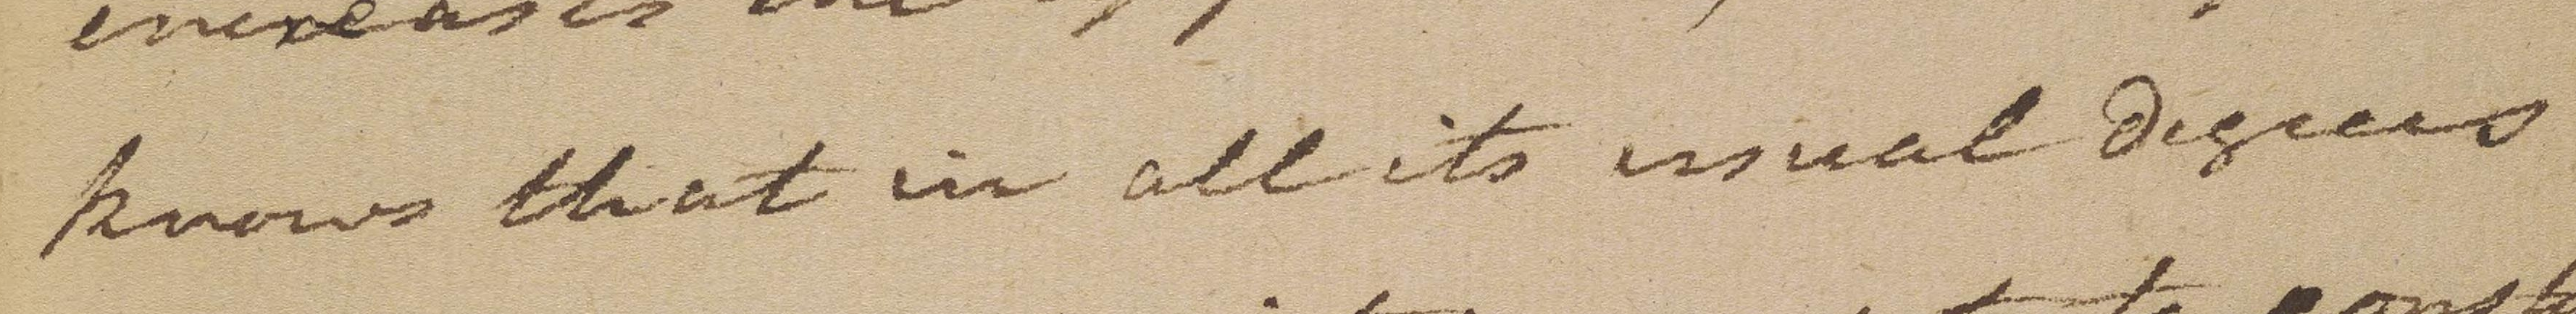knows that in all its usual degrees
